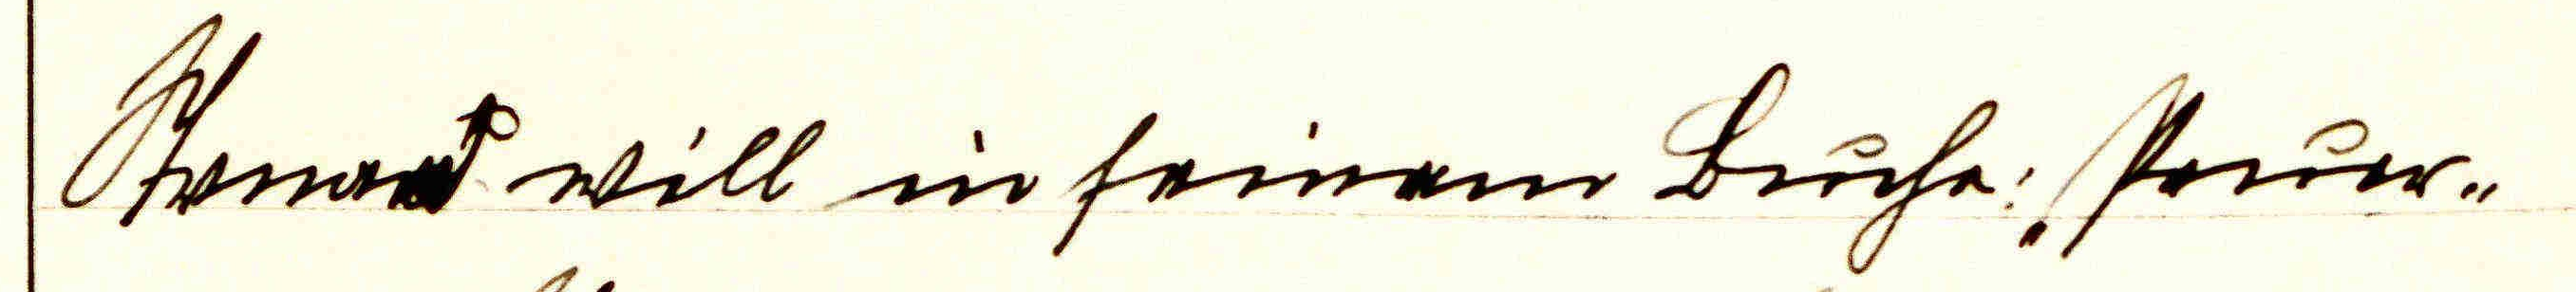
Strnad will in seinem Buche „Peuer-
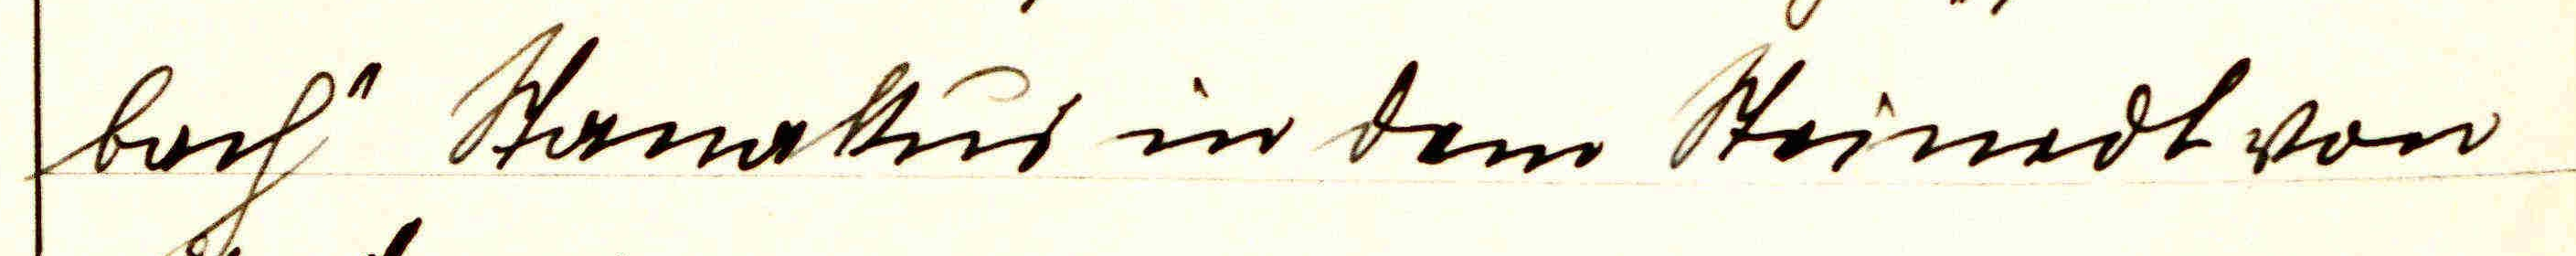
bach“ Stanakus in dem Steinedt von
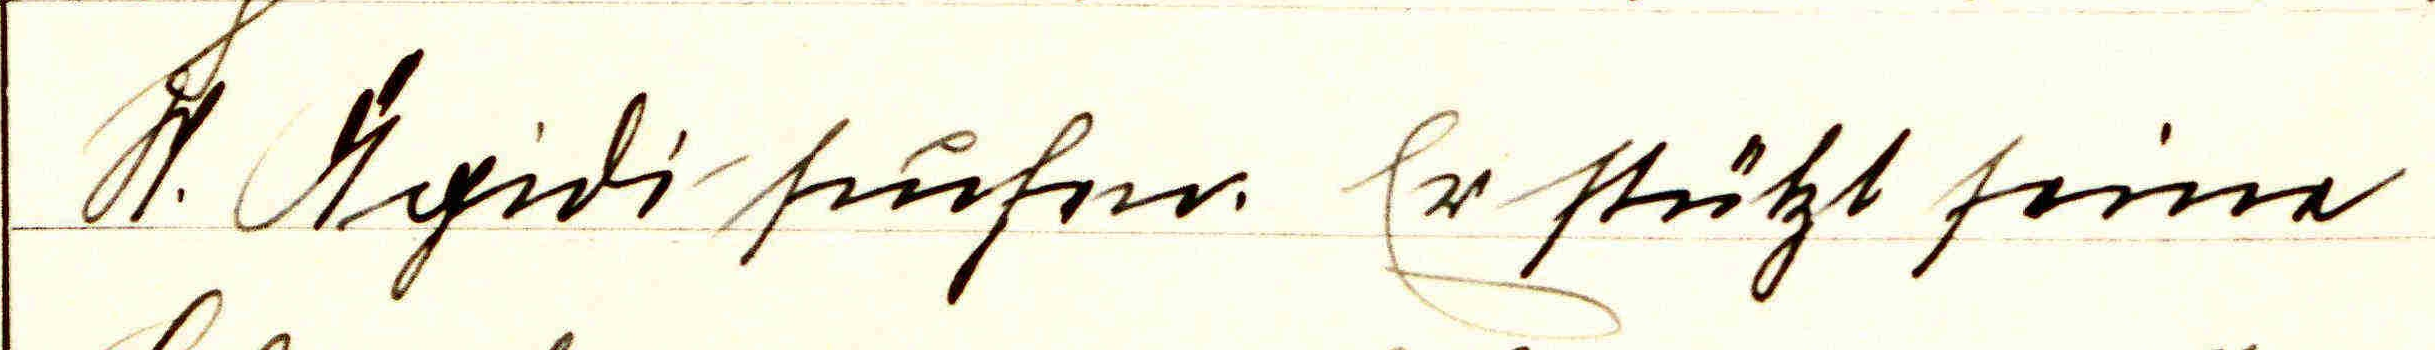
St. Ägidi suchen. Er stützt seine
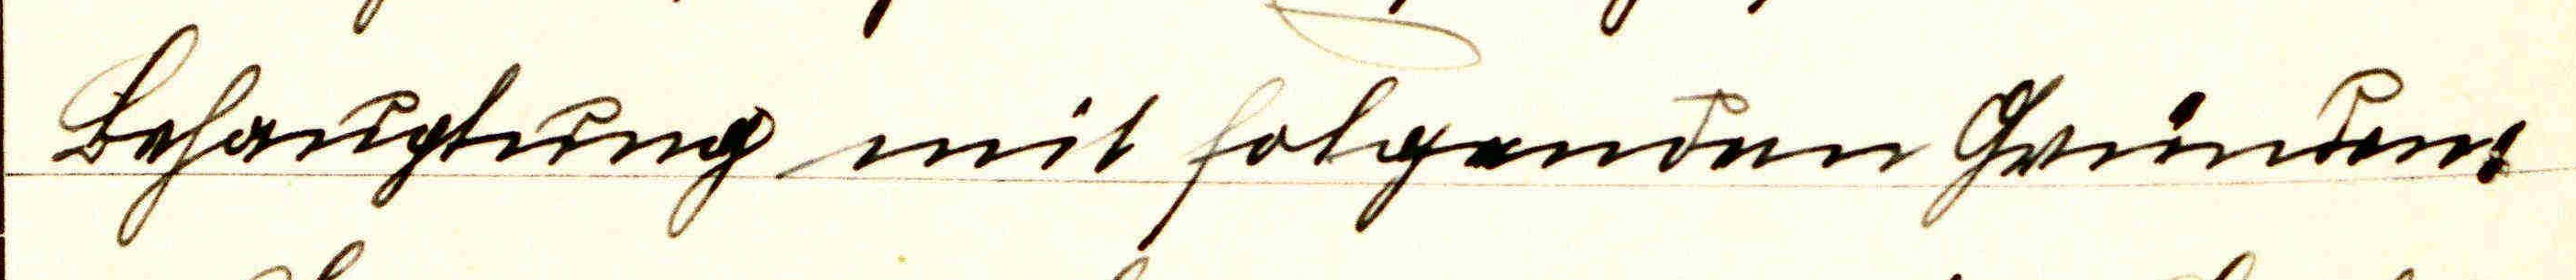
Behauptung mit folgendem Gründen.
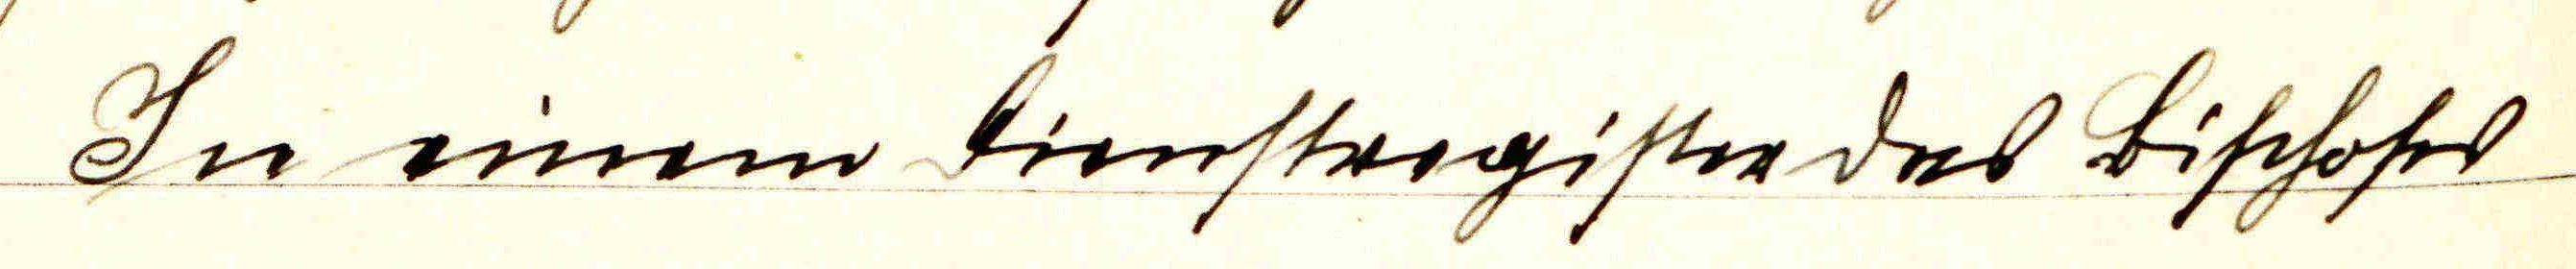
In einem Dienstregister des Bischofes
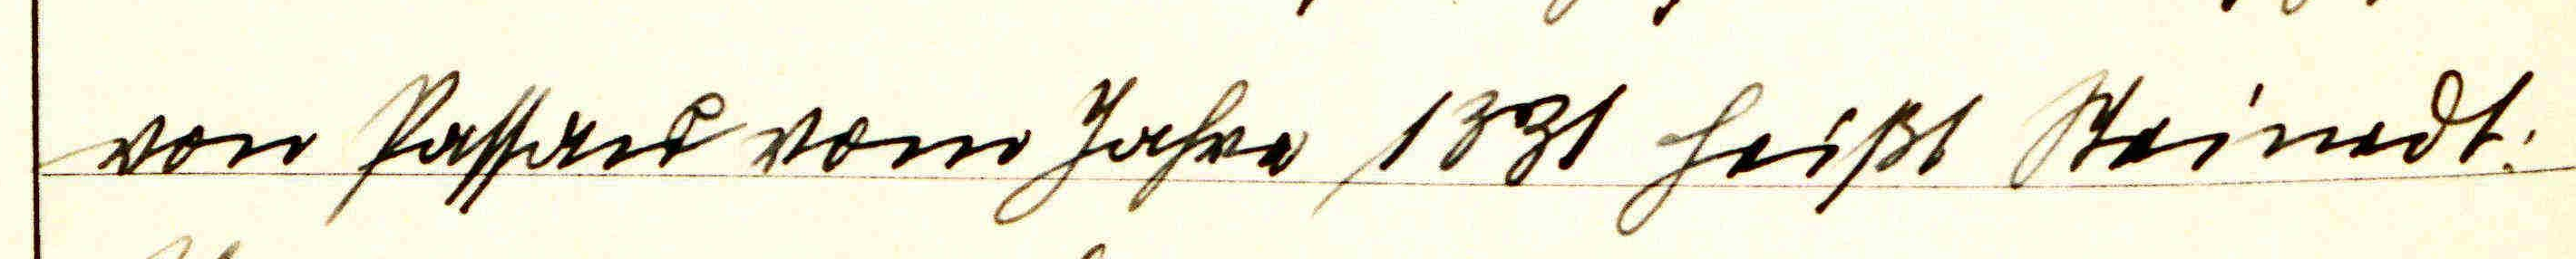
von Passau vom Jahr 1331 heißt Steinedt:
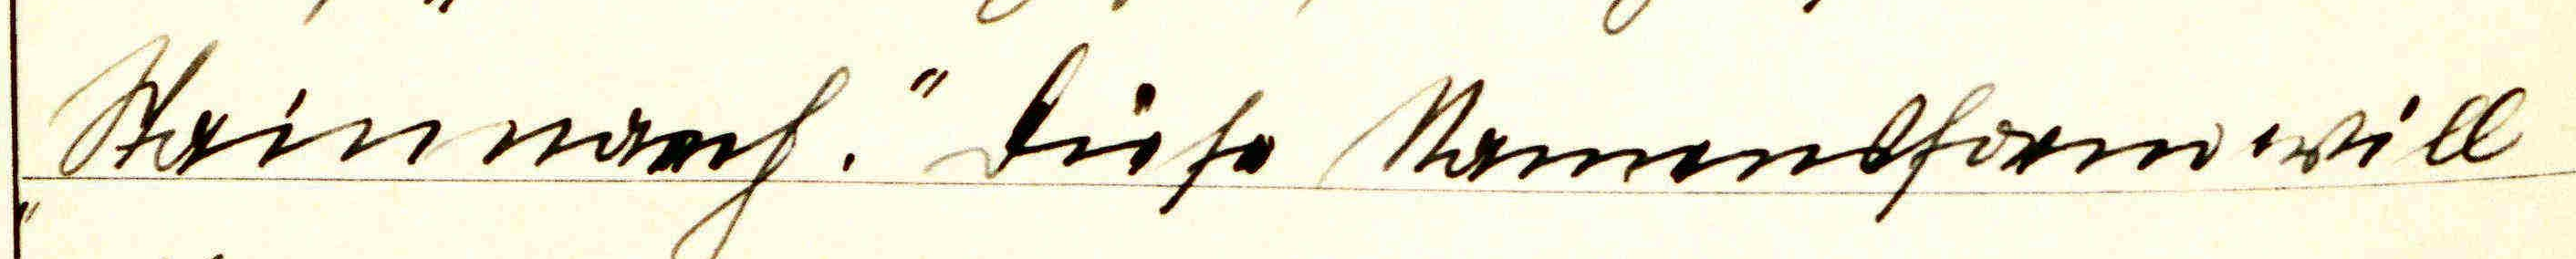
„Stainnaech“. Diese Namensform will
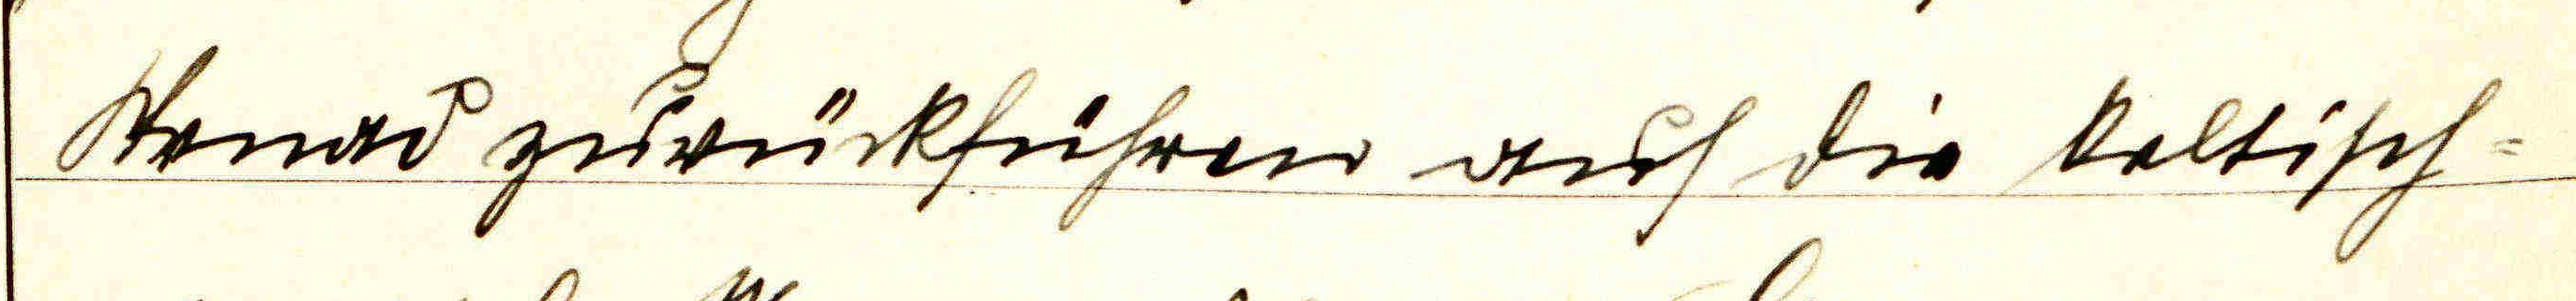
Strnad zurückführen auf die keltisch
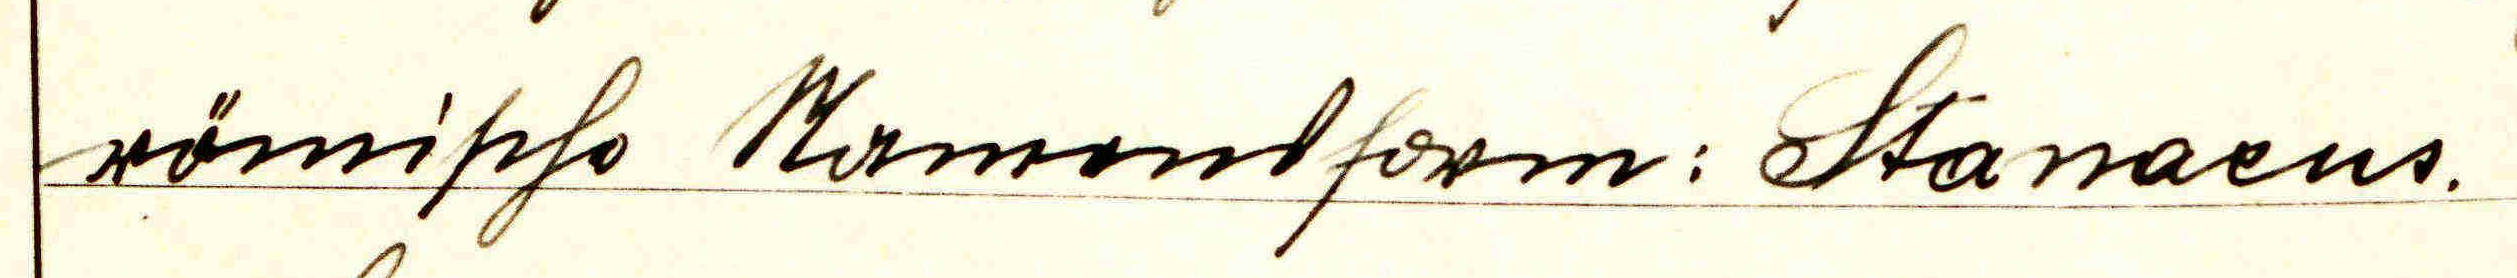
römische Namensform: Stanacus.
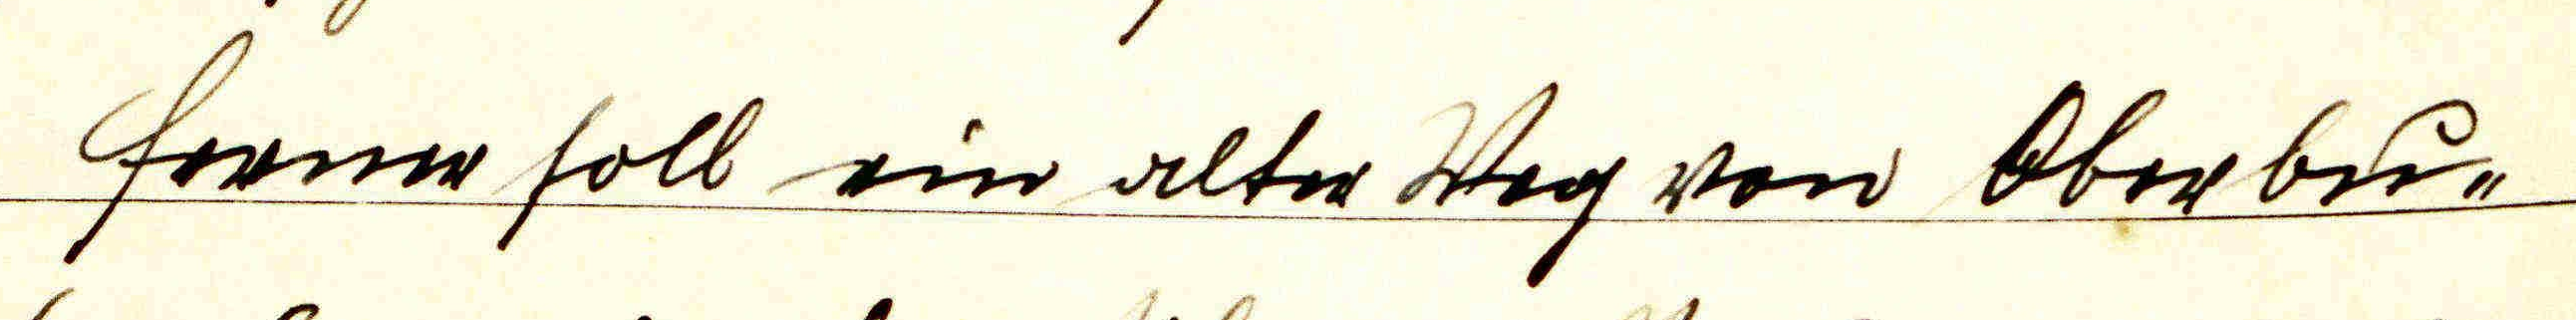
Ferner soll ein alter Weg von Oberbu-
